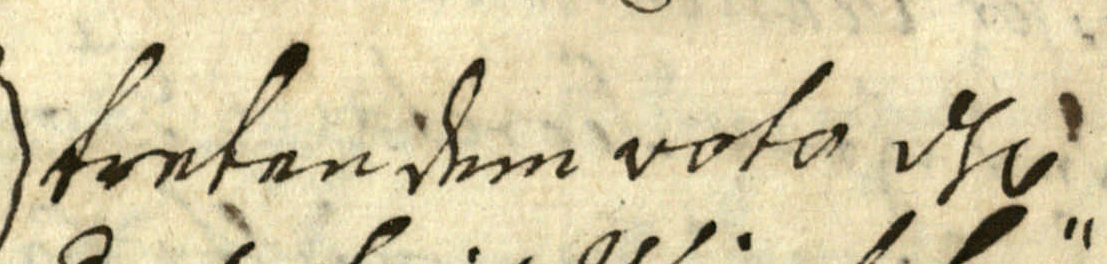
treten dem voto dh
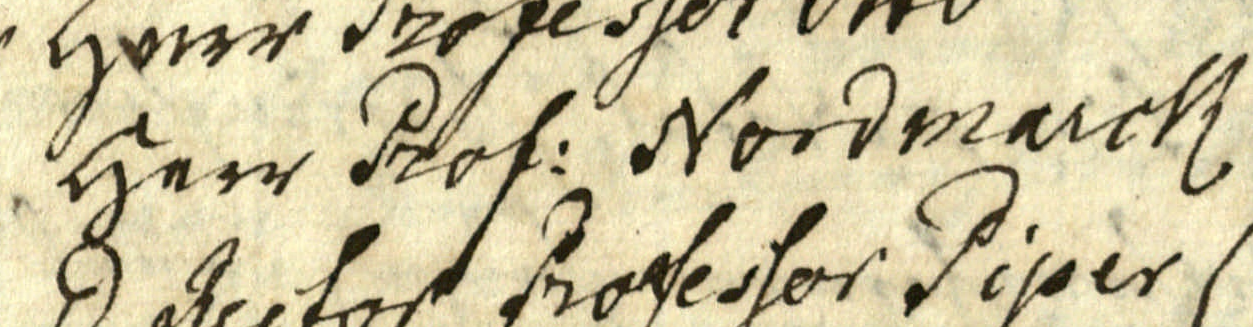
Herr Prof. Nordmarck
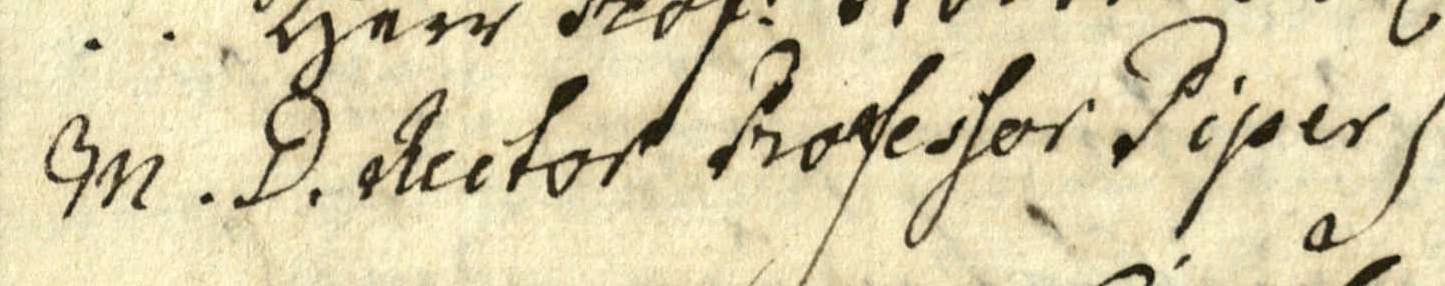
M. D. Rector Professor Piper,
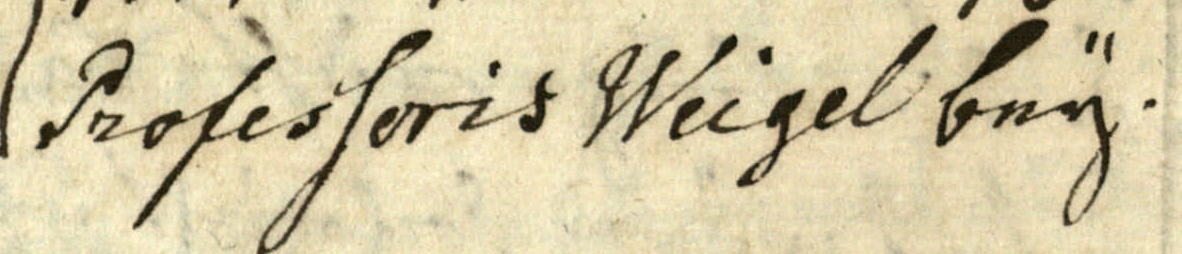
Professoris Weigel beÿ
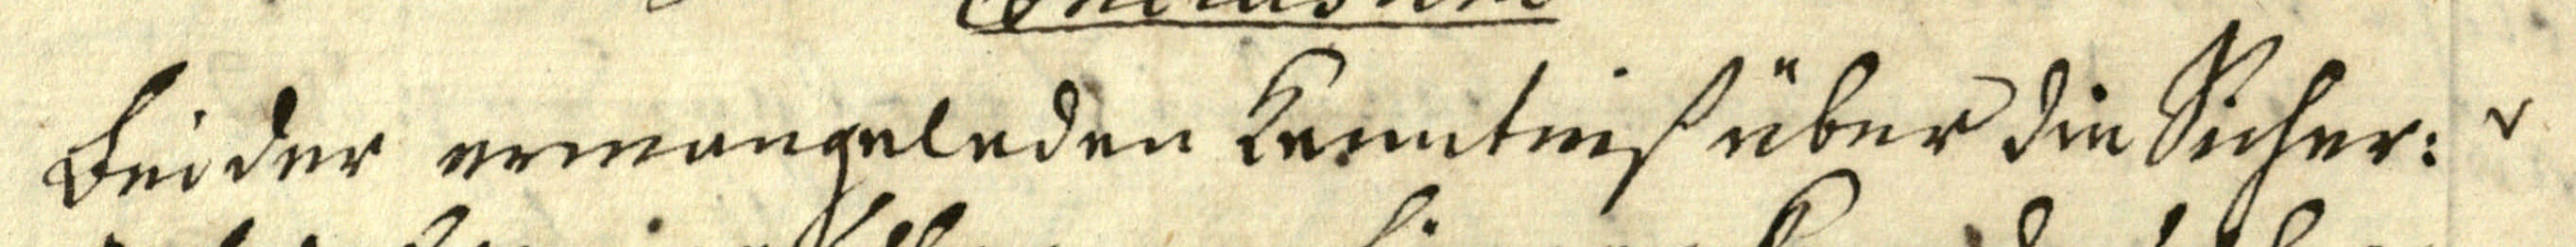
Bei der ermangelnden Kentniß über die Sicher¬
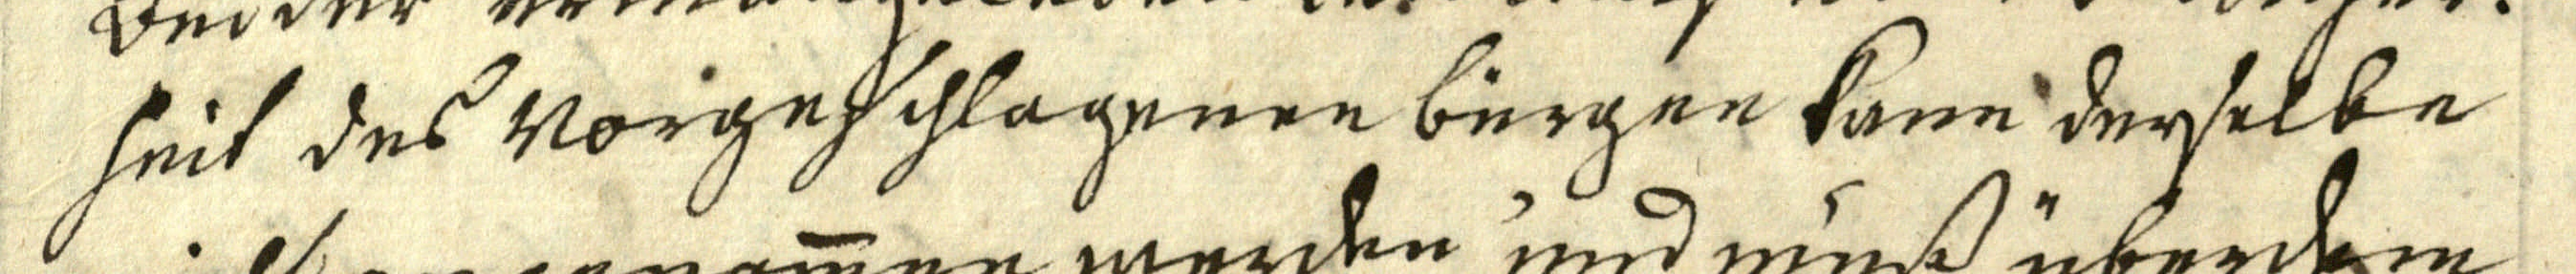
heit des vorgeschlagenen Bürgen kann derselbe
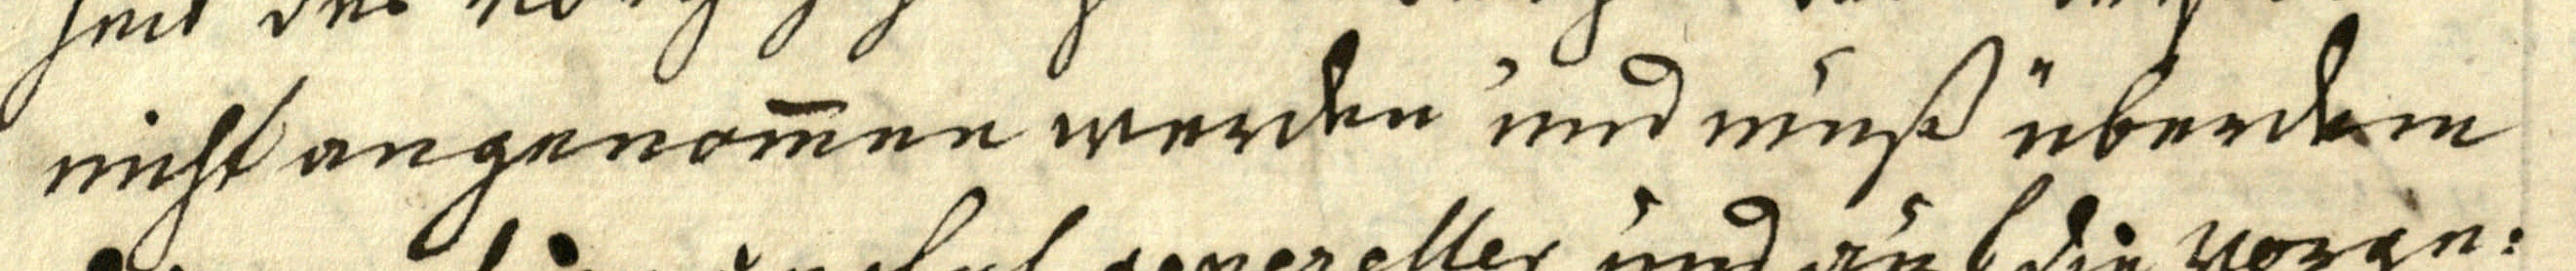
nicht angenomen werden und müße überdem
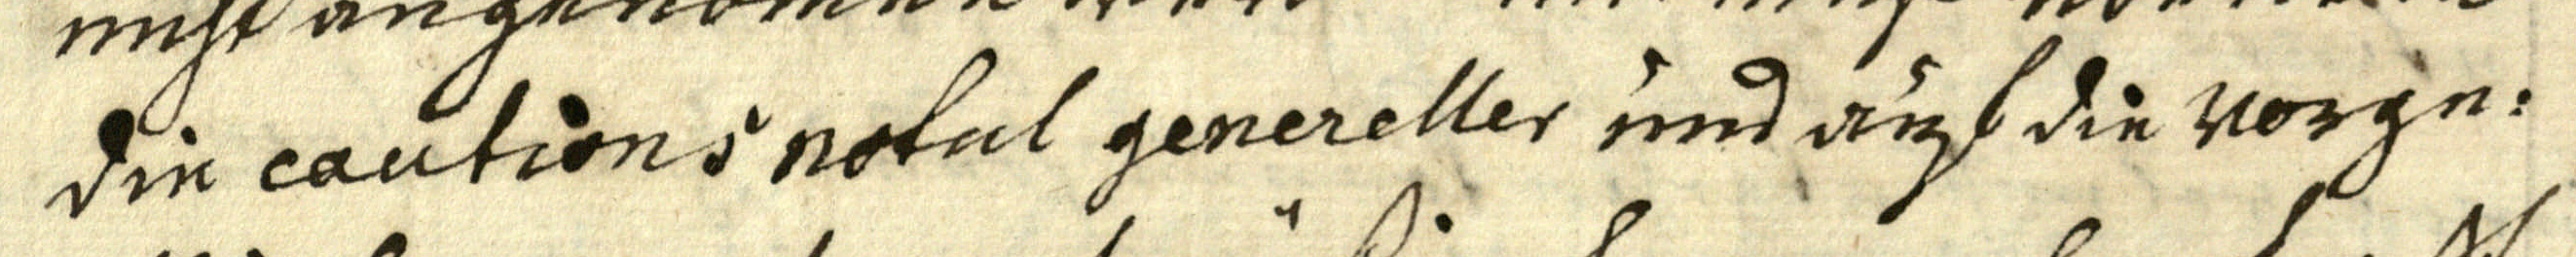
die cautions notul genereller und auf die vorge¬
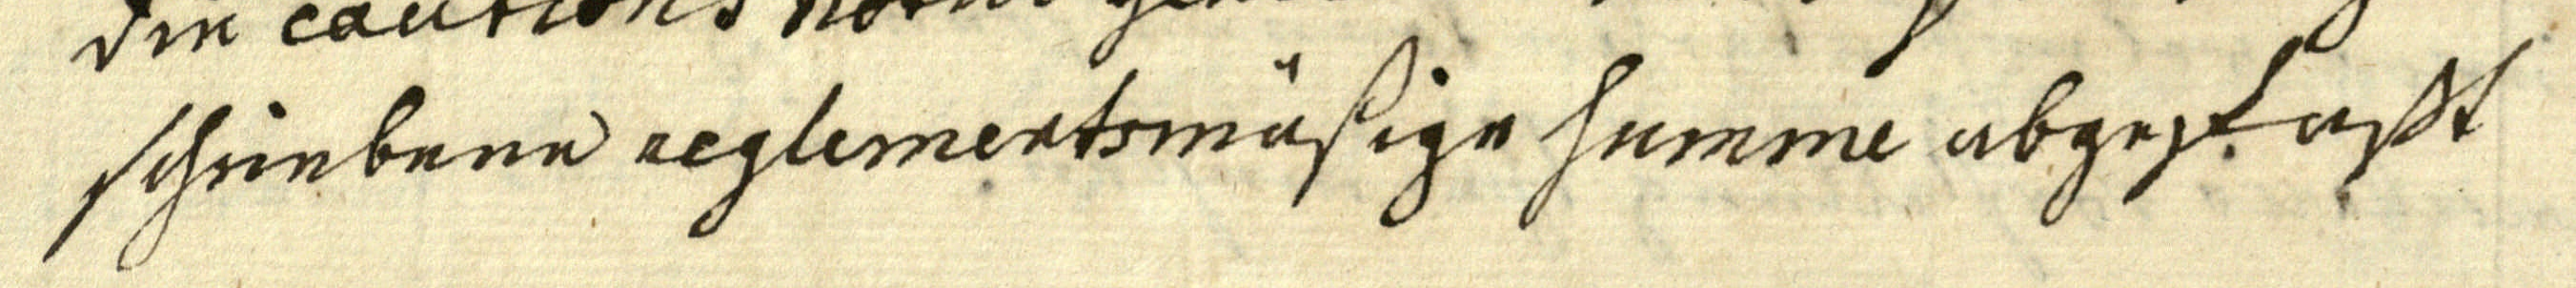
schriebene reglementsmäßige Summe abgefaßt
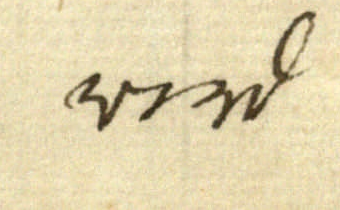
werd
